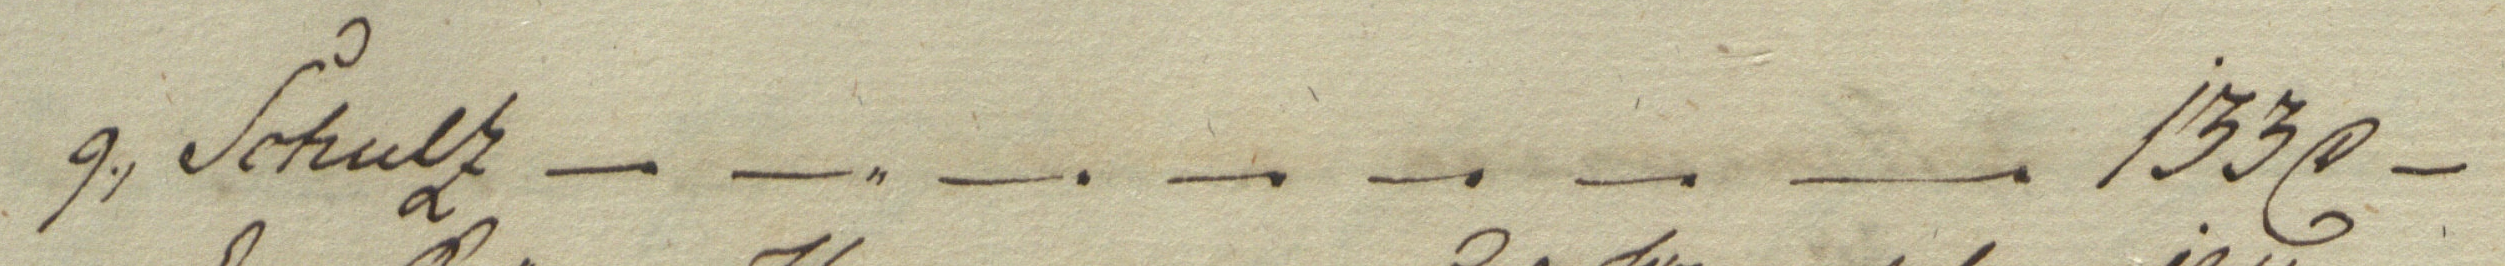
9., Schulz 133 l
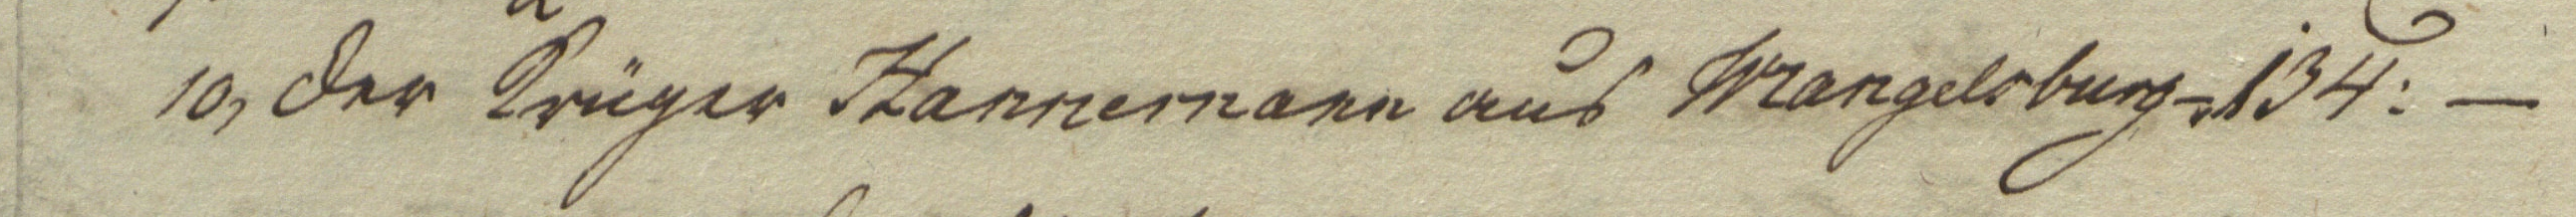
10, Der Krüger Hannemann aus Wrangelsburg 134:
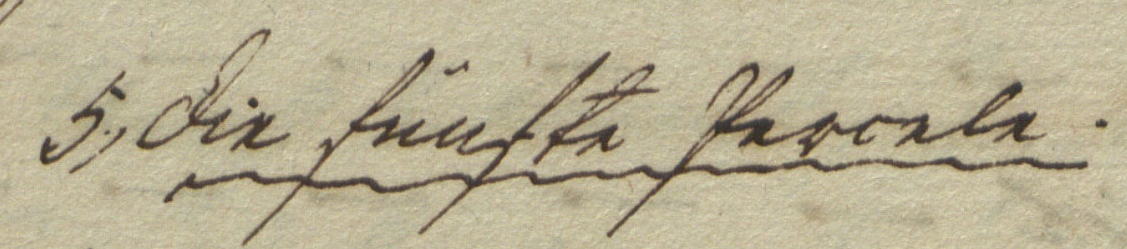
5, Die fünfte Percele
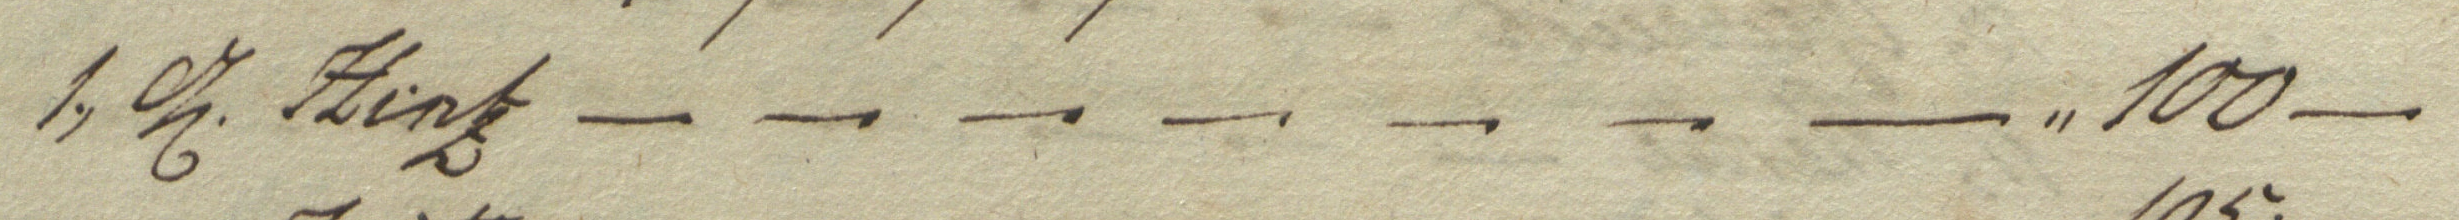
1., dh. Hintz 100:
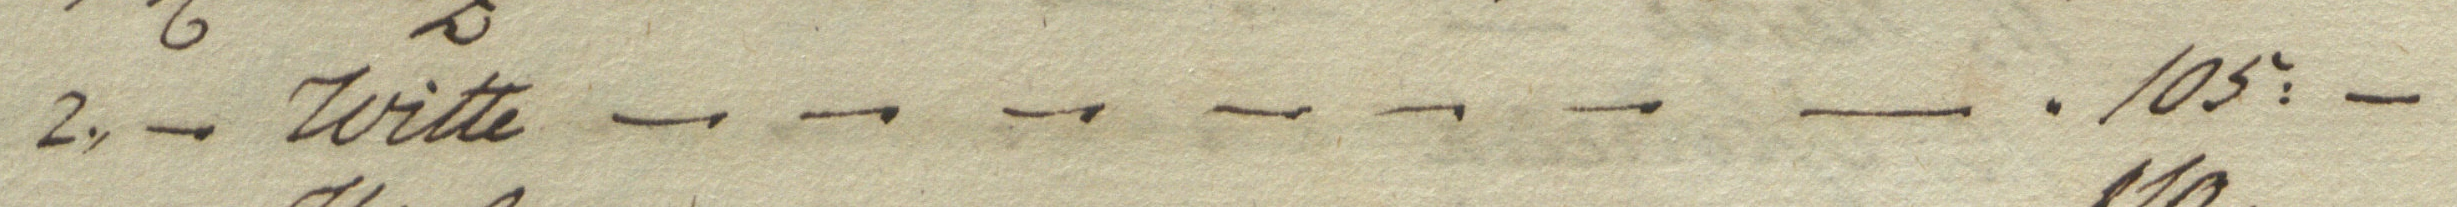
2., Witte 105:
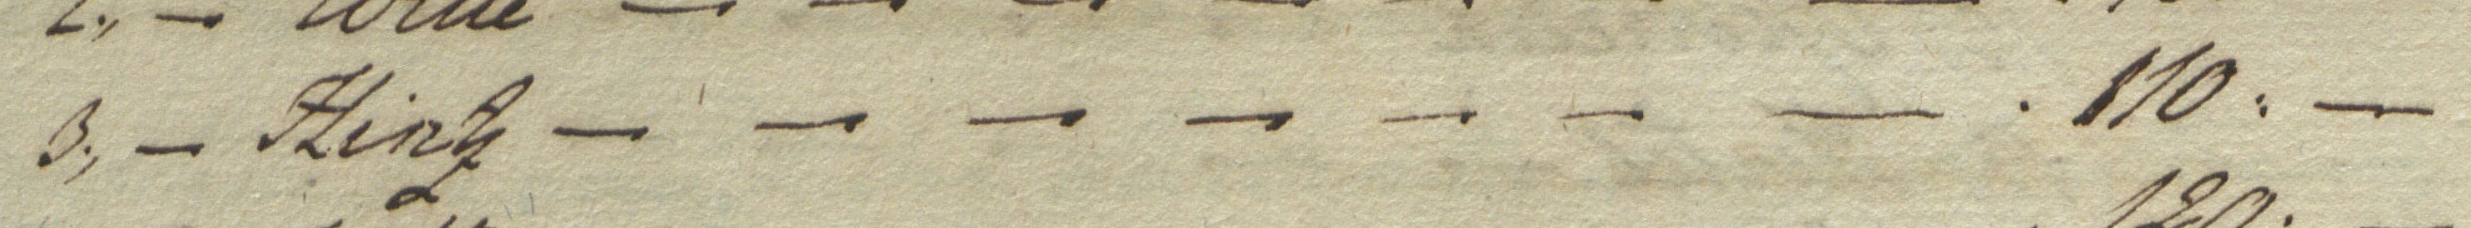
3., Hintz 110:
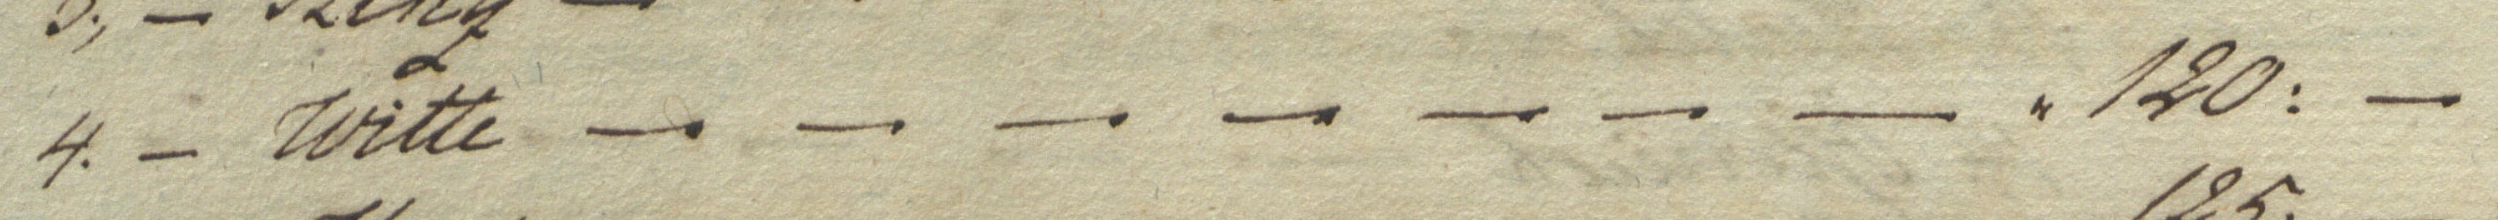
4. Witte 120:
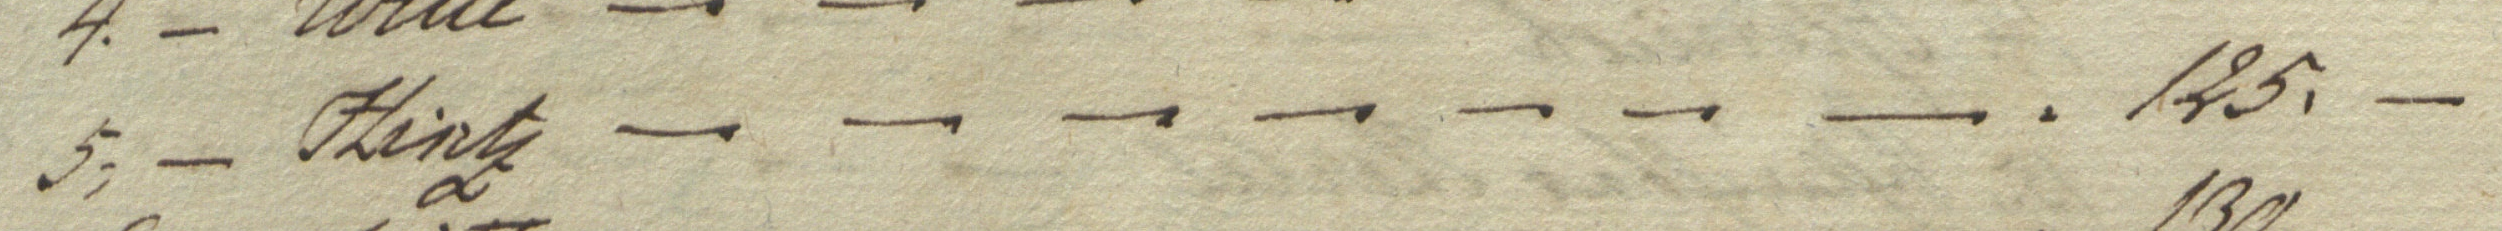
5., Hintz 125:
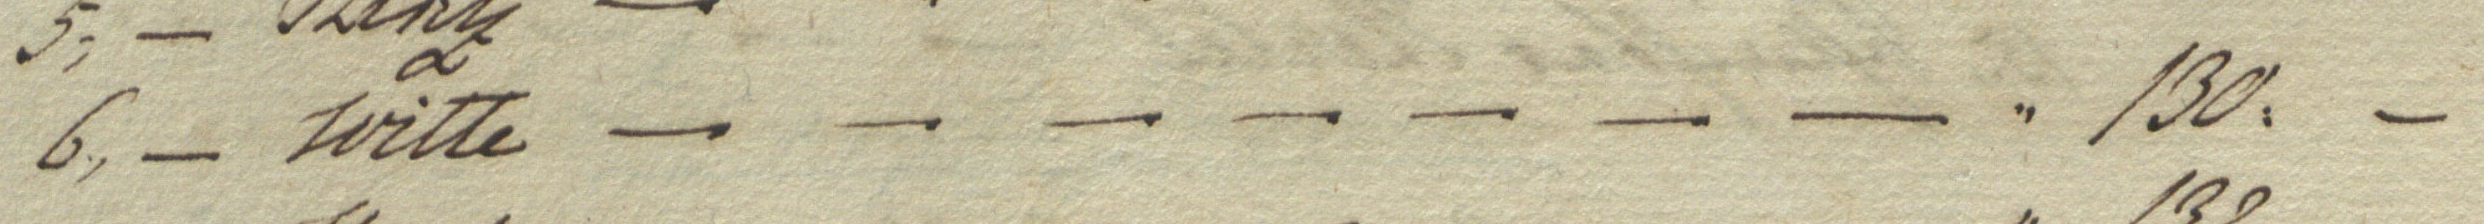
6., Witte 130:
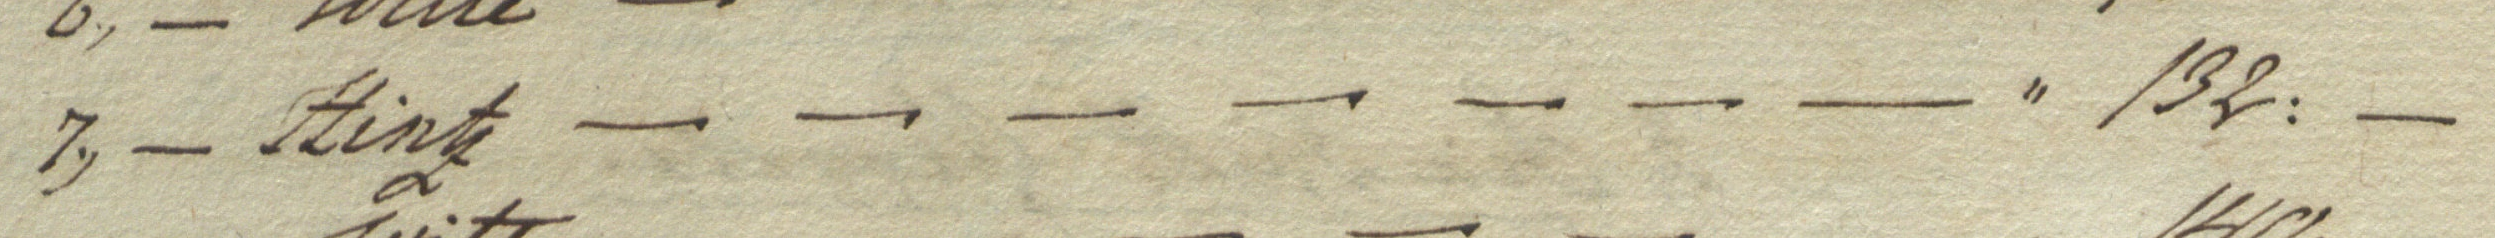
7., Hintz 132:
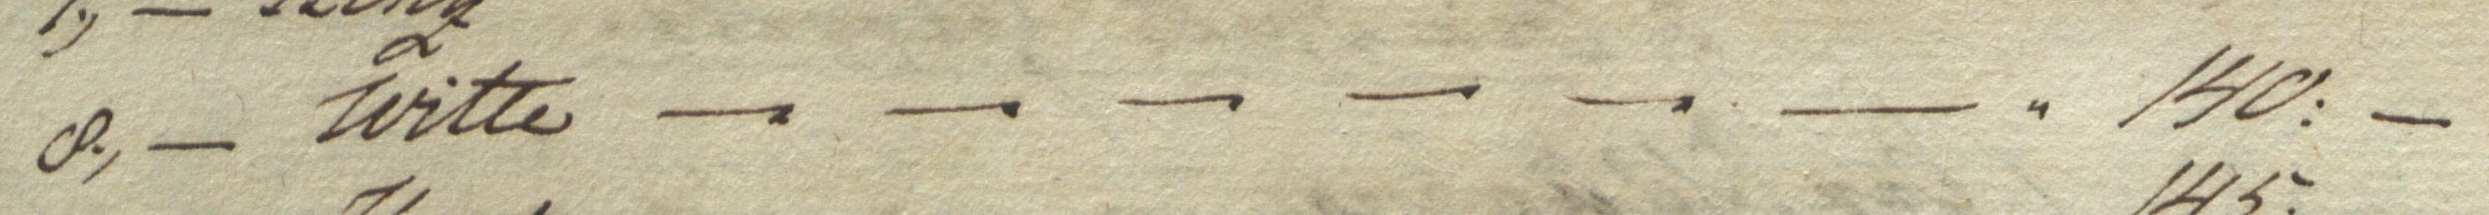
8., Witte 140:
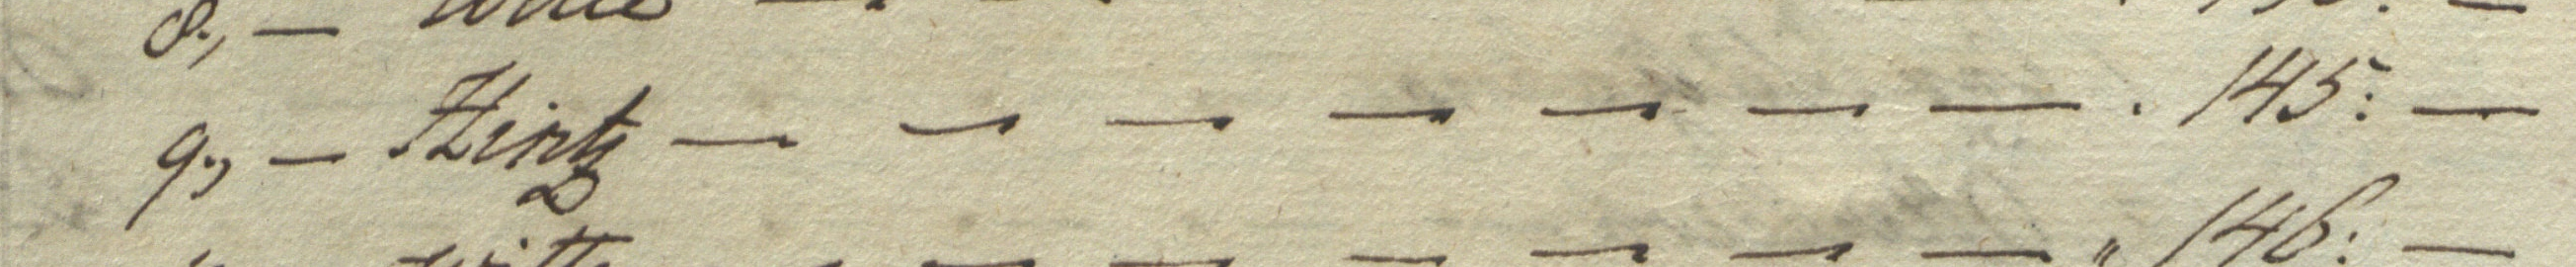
9., Hintz 145:
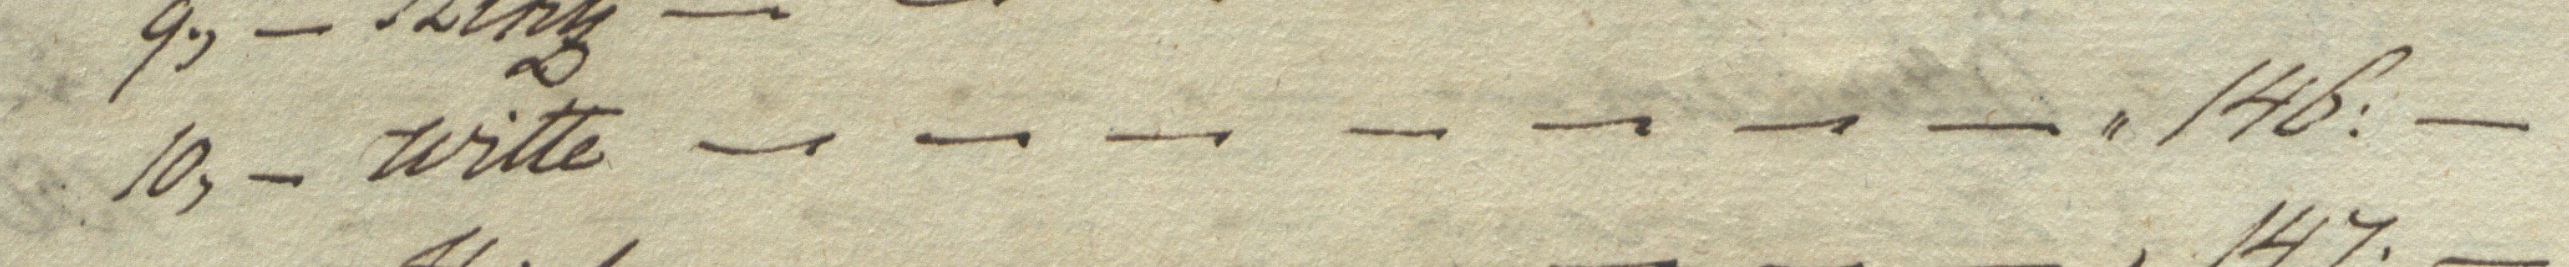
10., Witte 146:
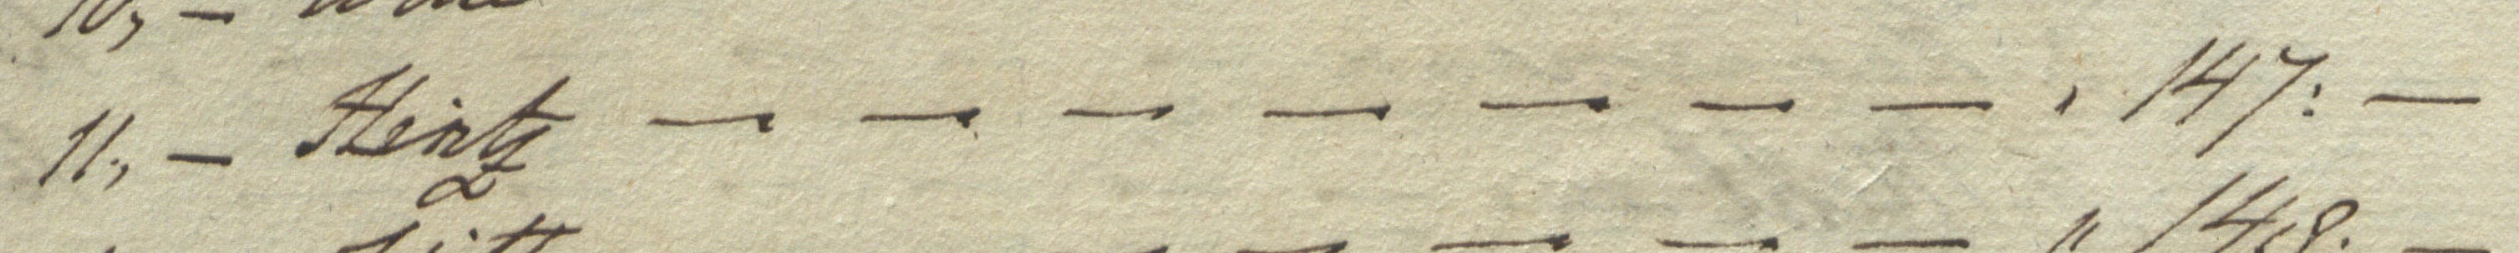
11., Hintz 147:
